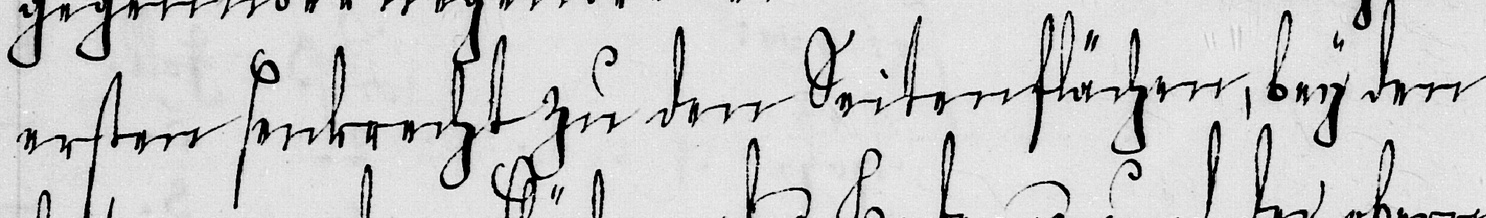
ersten senkrecht zu den Seitenflächen, bey den
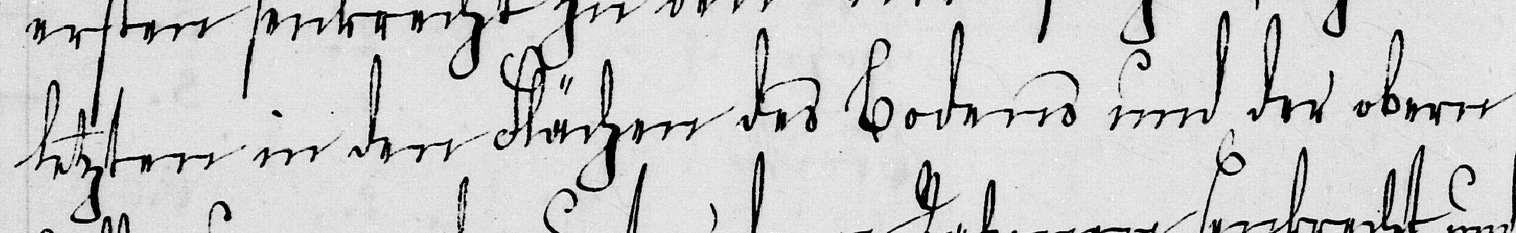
letzten in den Flächen des Bodens und der obern
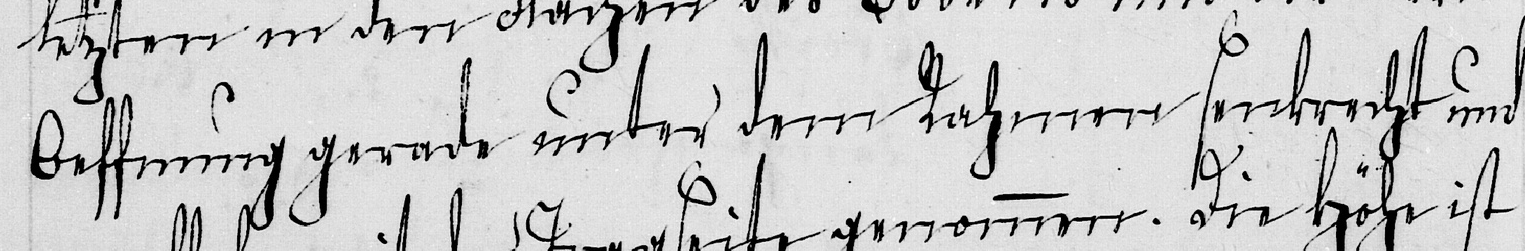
Oeffnung gerade unter dem Rahmen senkrecht und
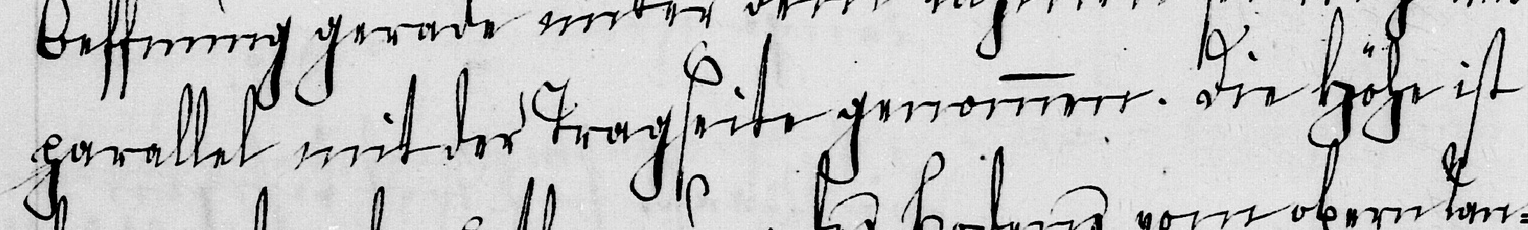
parallel mit der Tragseite genommen. Die Höhe ist
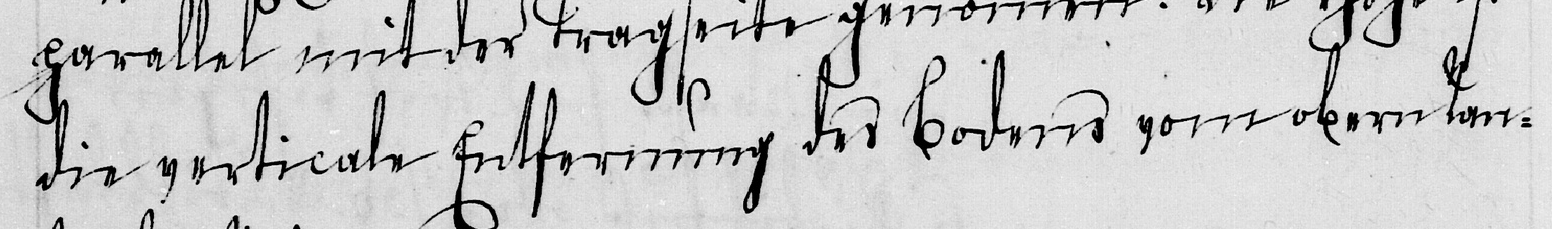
die verticale Entfernung des Bodens vom obern Ran¬
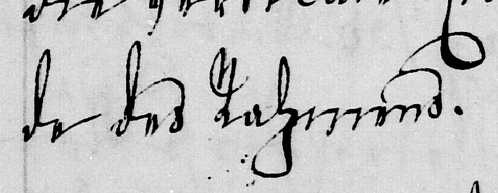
de des Rahmens.
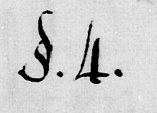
§. 4.
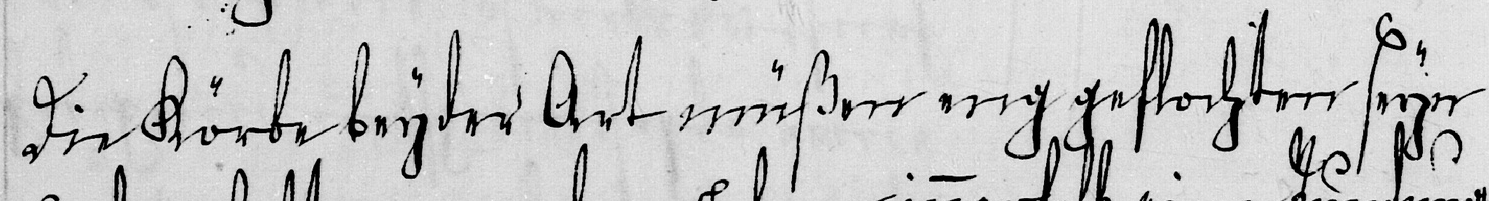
Die Körbe beyder Art müßen eng geflochten seyn
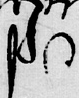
1.
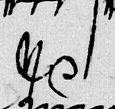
Strich
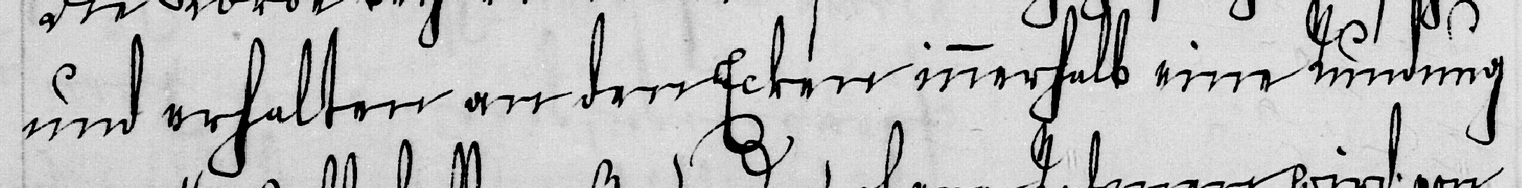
und erhalten an den Ecken innerhalb eine Rundung
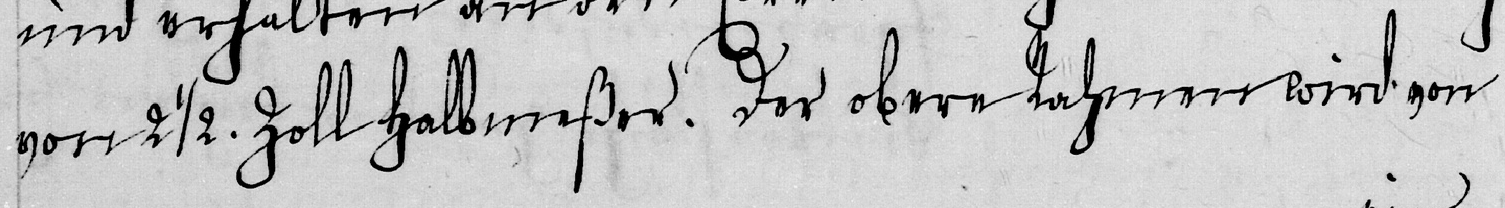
von 2 1/2. Zoll Halbmeßer. Der obere Rahmen wird von
